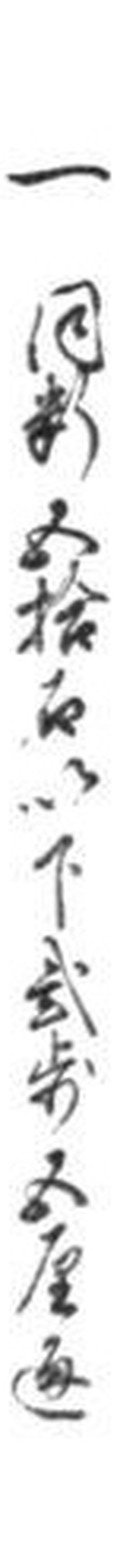一同断五拾石以下弐歩五厘通
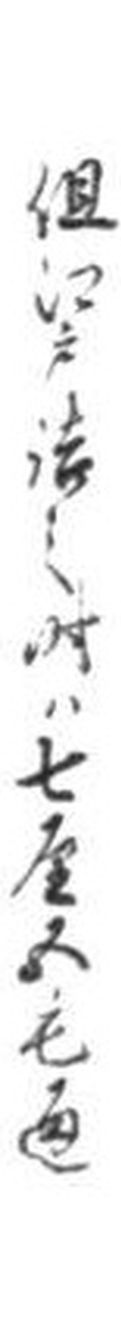但江戸詰之時ハ七厘五毛通
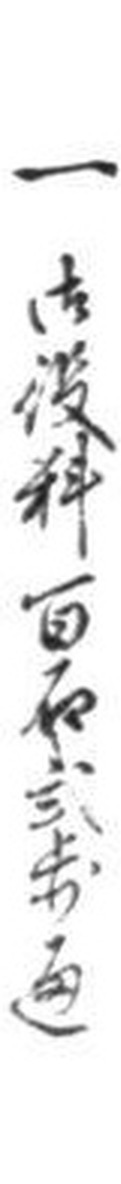一御役料百石弐歩通
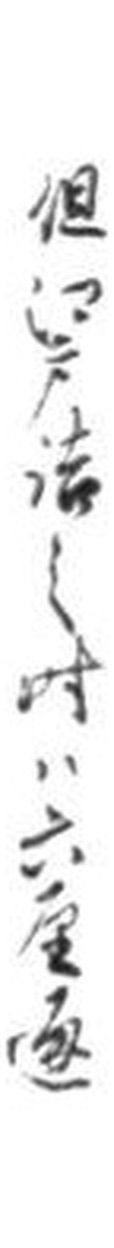但江戸詰之時ハ六厘通
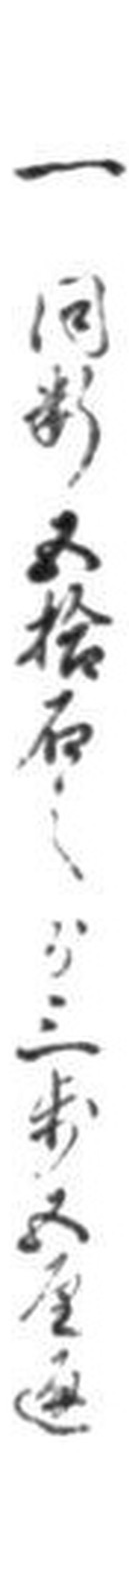一同断五拾石之分三歩五厘通
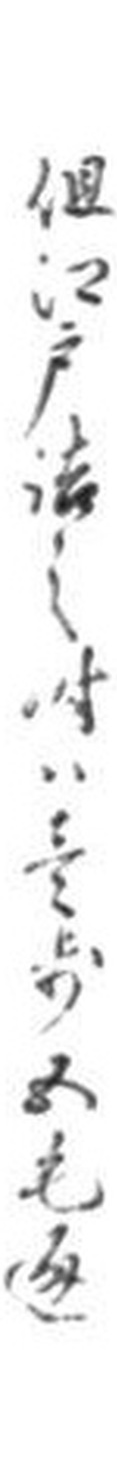但江戸詰之時ハ壱歩五毛通
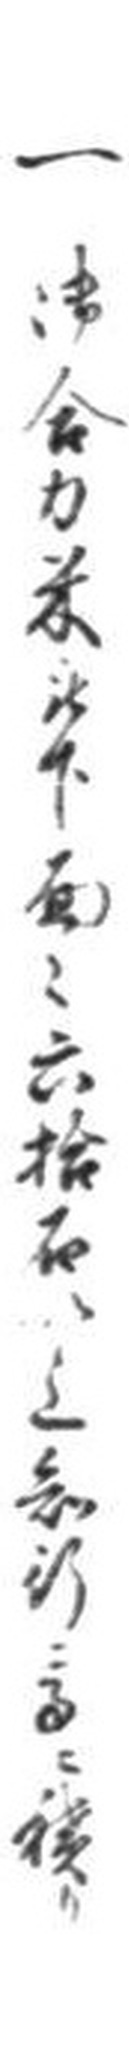一御合力米被下面々六拾石以上知行高ニ積り
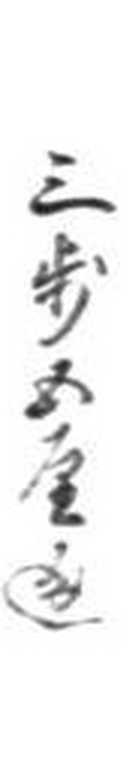三歩五厘通
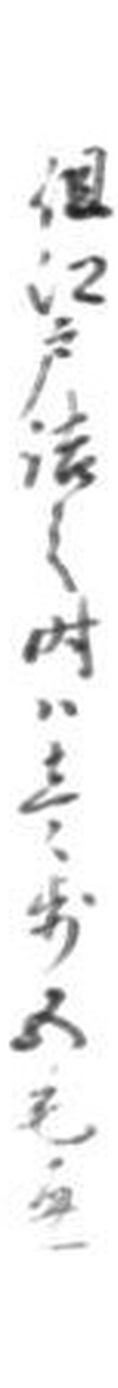但江戸詰之時ハ壱歩五毛通
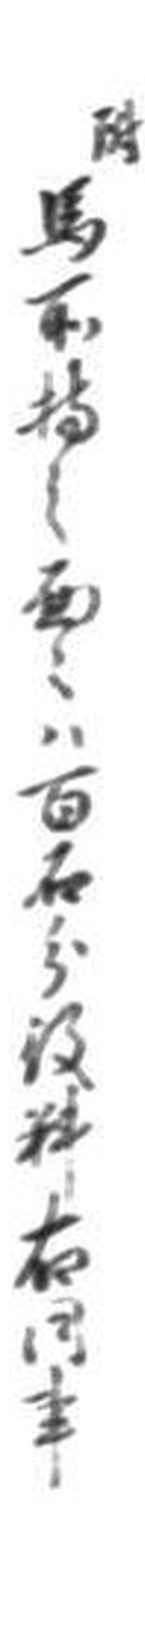馬所持之面々ハ百石分役料右同事
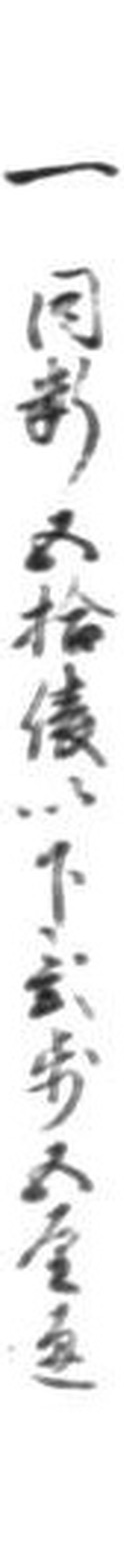一同断五拾俵以下弐歩五厘通
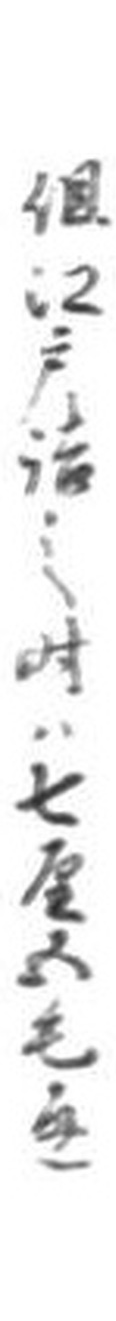但江戸詰之時ハ七厘五毛通
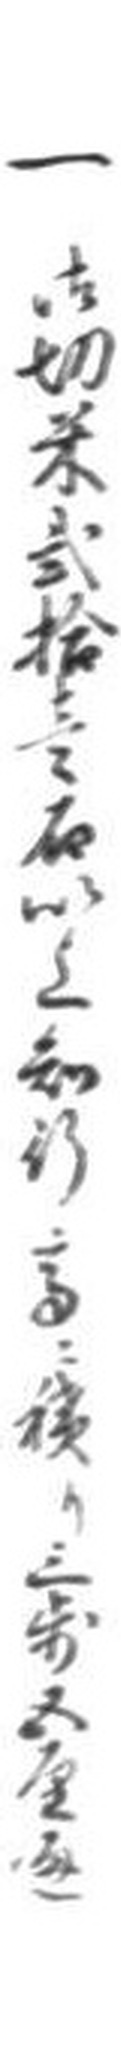一御切米弐拾壱石以上知行高ニ積り三歩五厘通
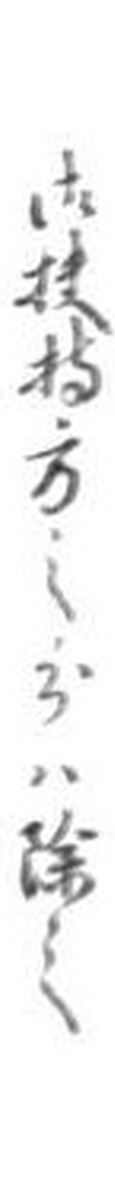御扶持方之分ハ除之
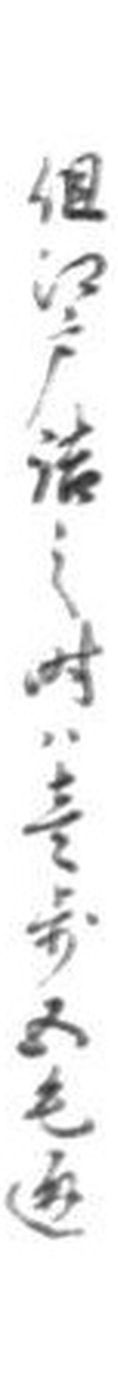但江戸詰之時ハ壱歩五毛通
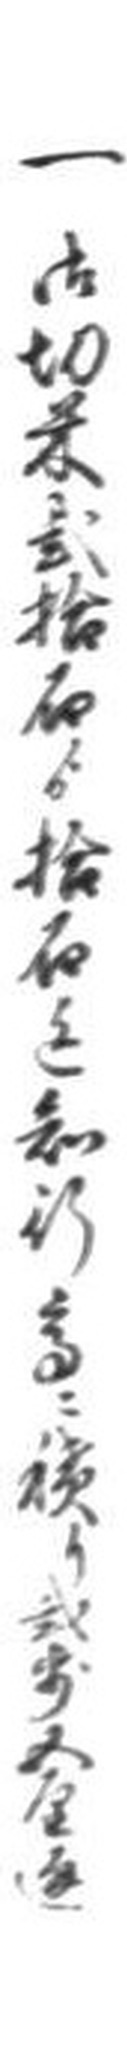一御切米弐拾石ゟ拾石迄知行高ニ積り弐歩五厘通
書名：家譜 三十八 宗矩公 従享保九年五月到享保九年十二月
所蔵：福井県文書館 Fukui Prefectural Archives
